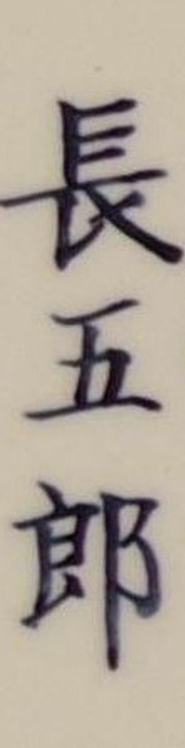長五郎
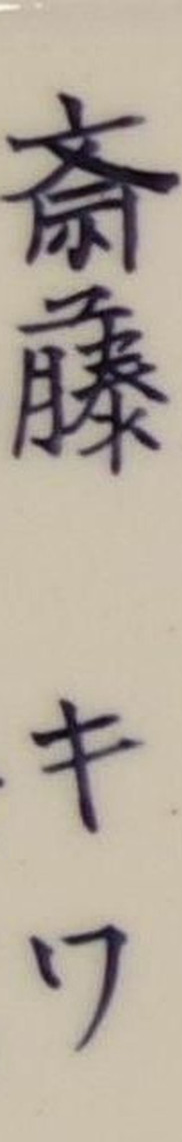斎藤キワ
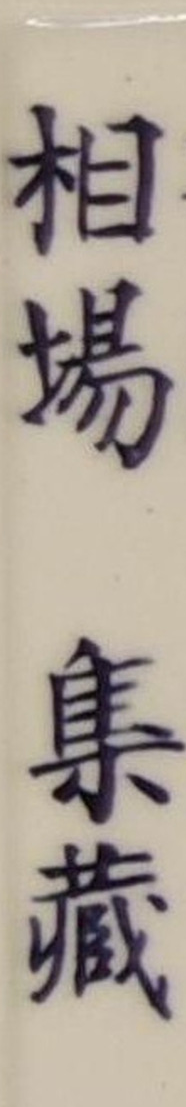相場集蔵

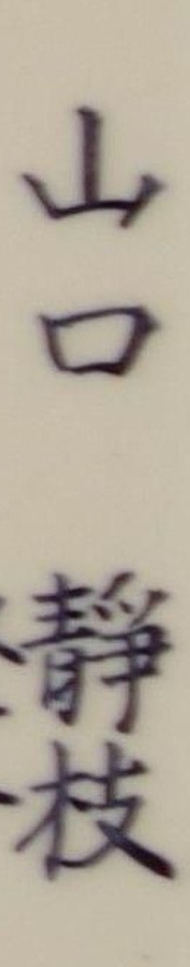山口静枝
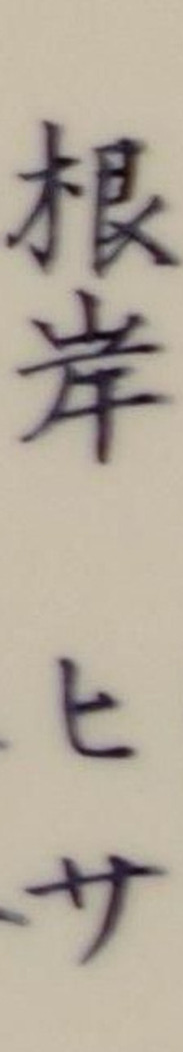根岸ヒサ
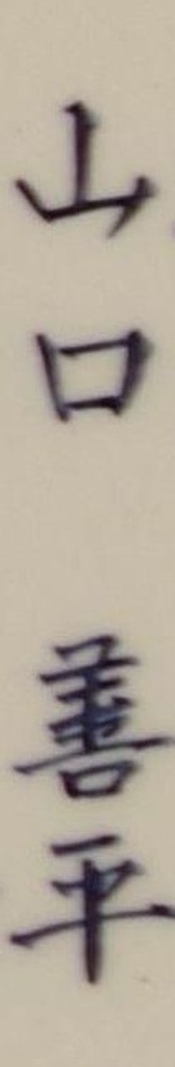山口善平
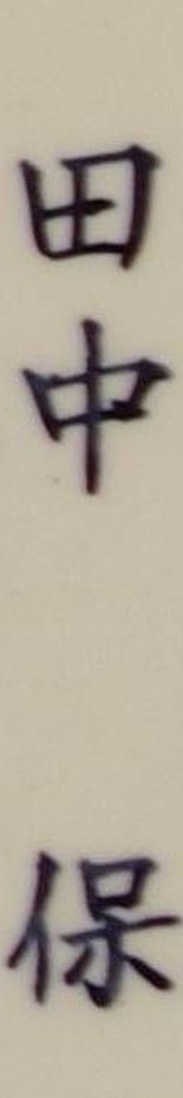田中保
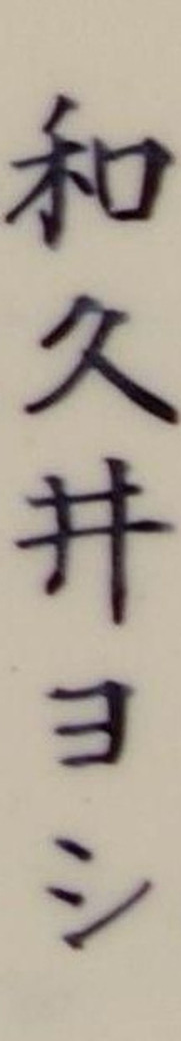和久井ヨシ
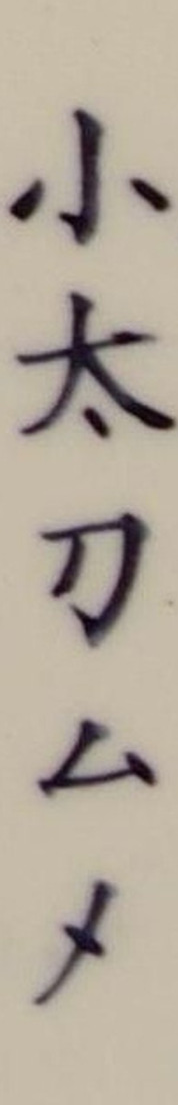小太刀ムメ
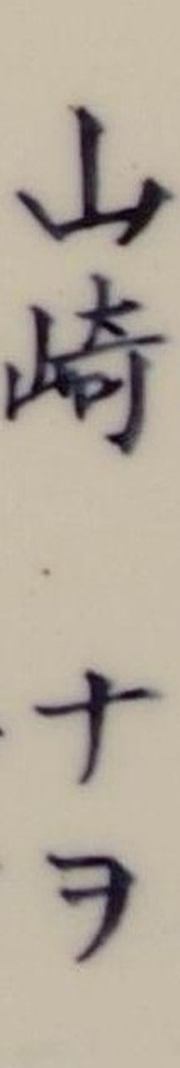山崎ナヲ
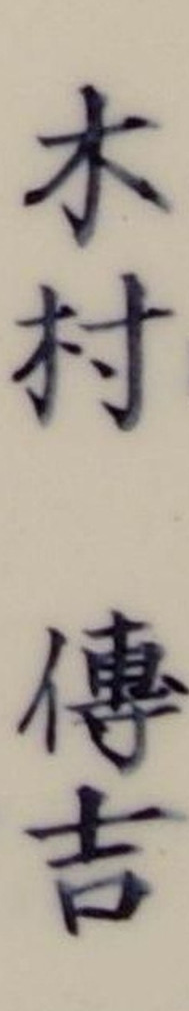木村傳吉
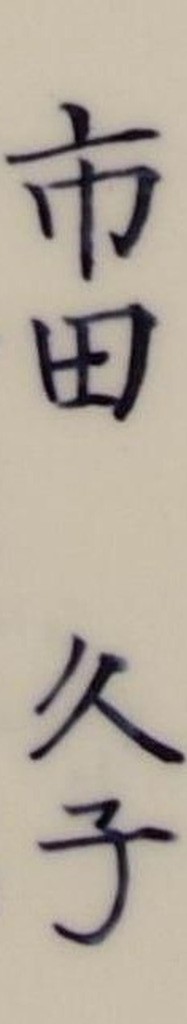市田久子
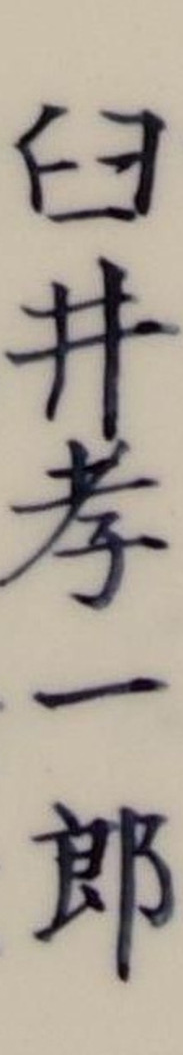臼井孝一郎
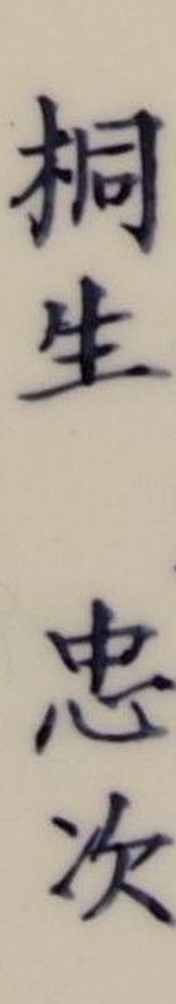桐生忠次
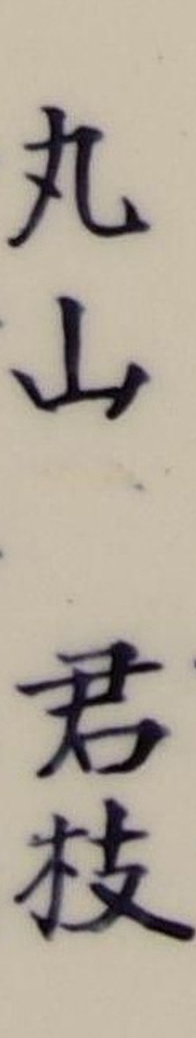丸山君枝
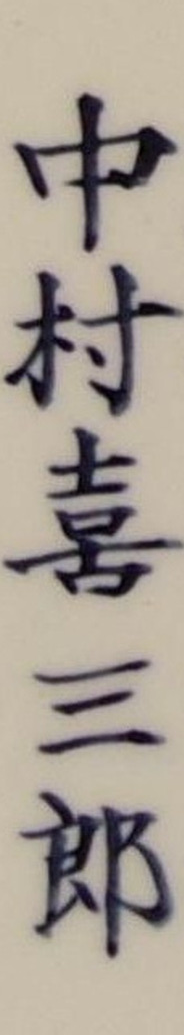中村喜三郎
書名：E~L
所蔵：高野山金剛峯寺
